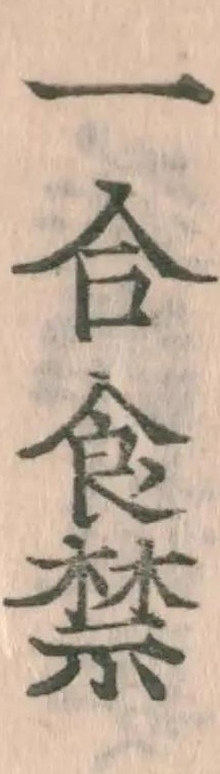一合食禁
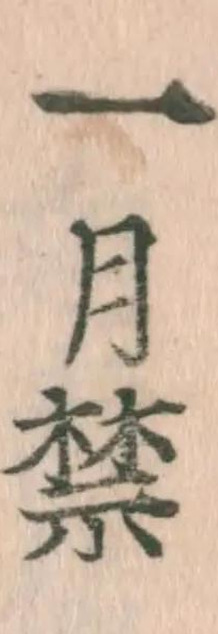一月禁
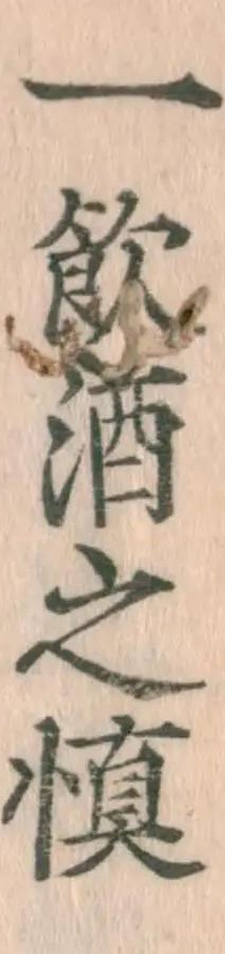一飲酒之慎
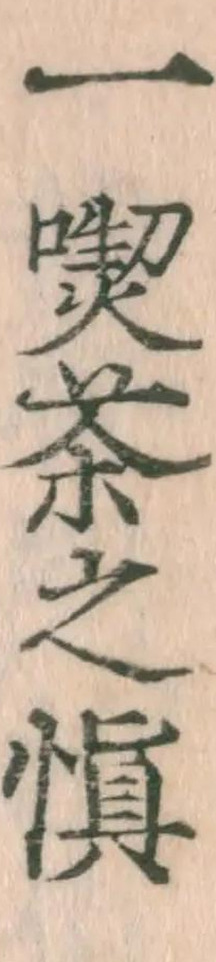一喫茶之慎
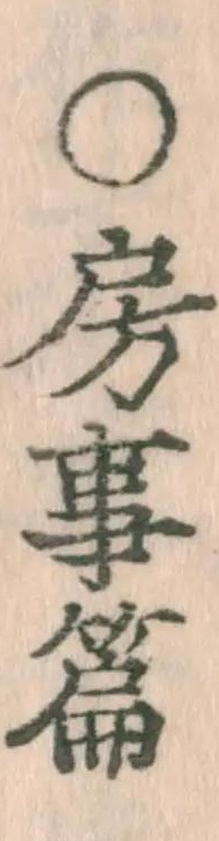〇房事篇
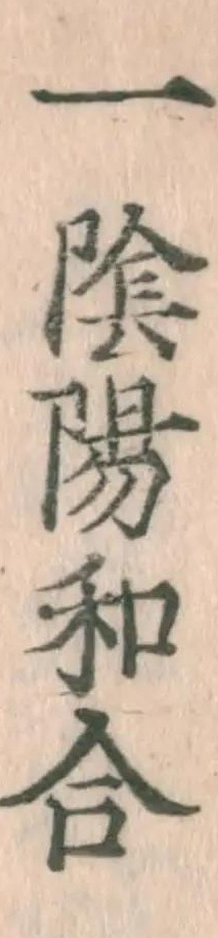一陰陽和合
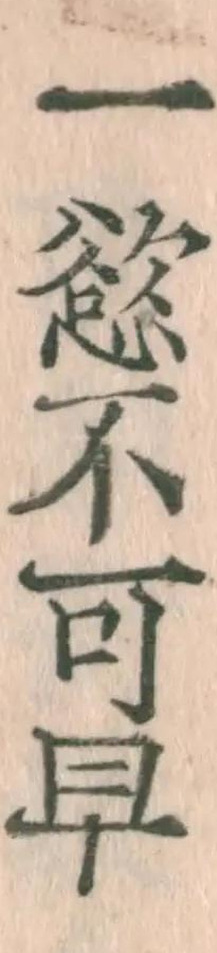一慾不可早
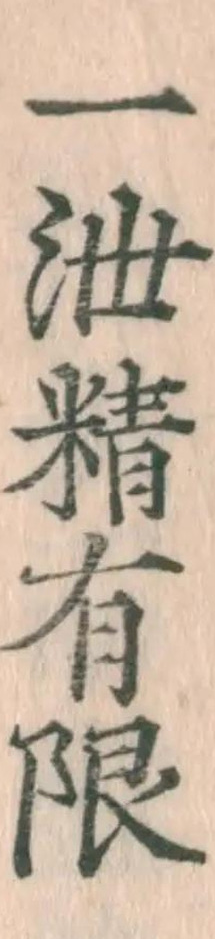一泄精有限
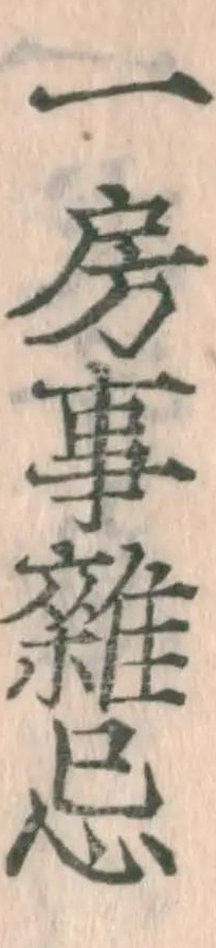一房事雑忌
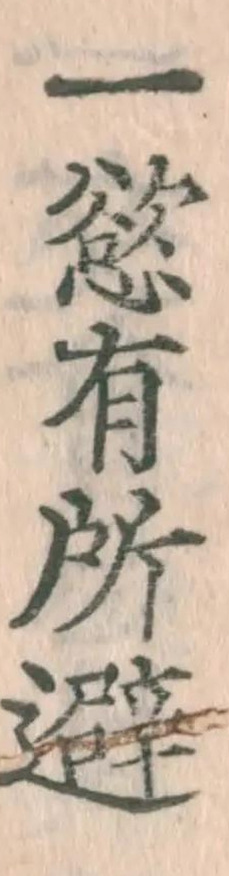一慾有所避

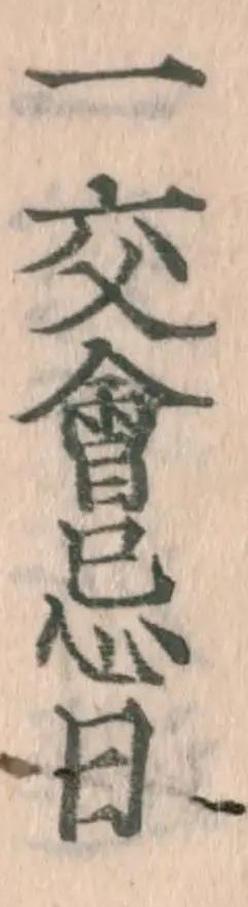一交会忌日
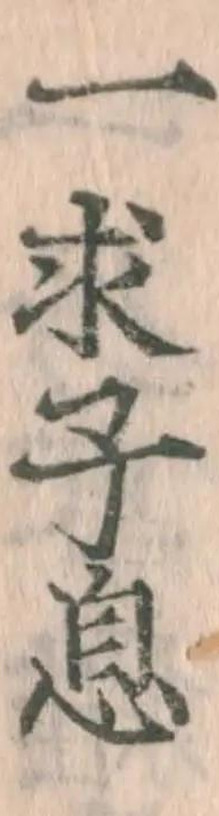一求子息
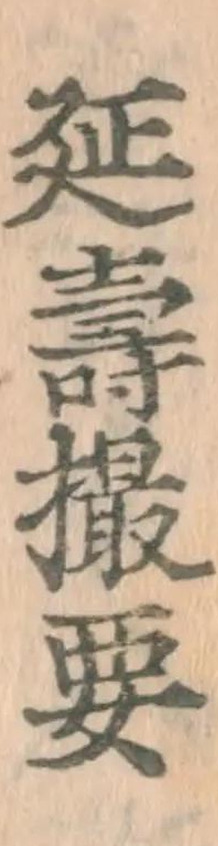延寿撮要
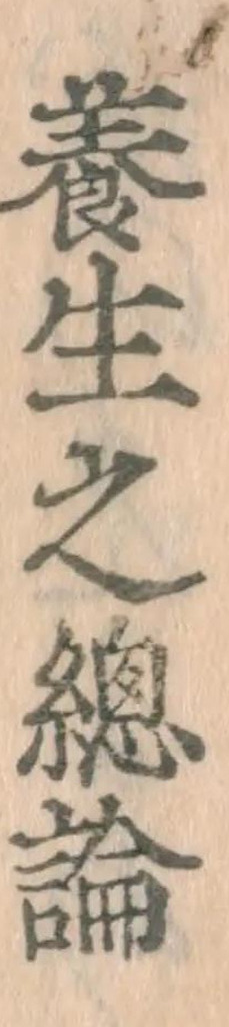養生之総論

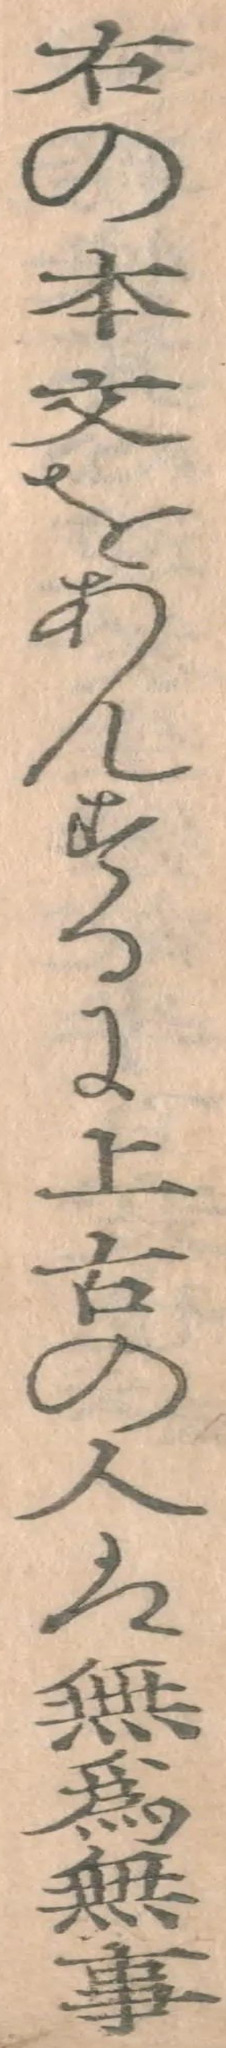右の本文をあんするに上古の人は無為無事
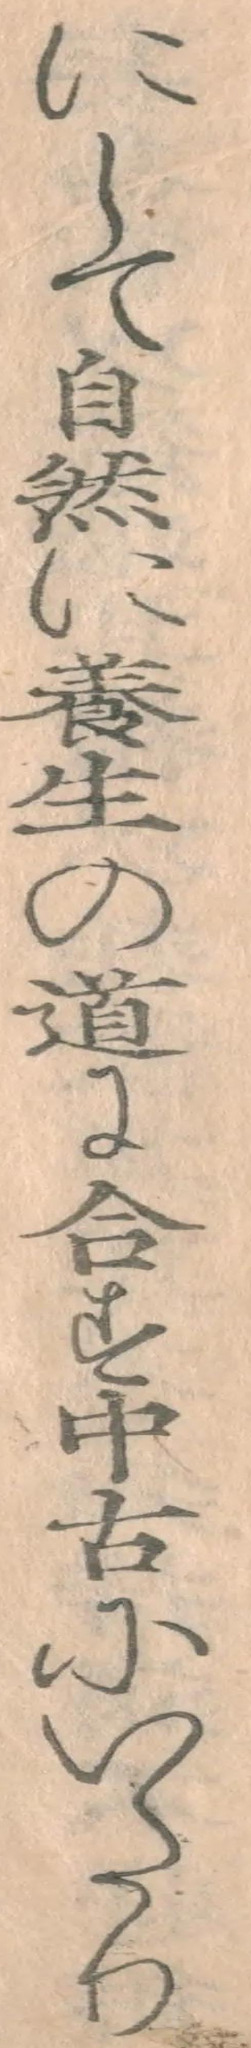にして自然に養生の道に合す中古にいたり
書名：延壽撮要
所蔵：国立国会図書館 National Diet Library, JAPAN
